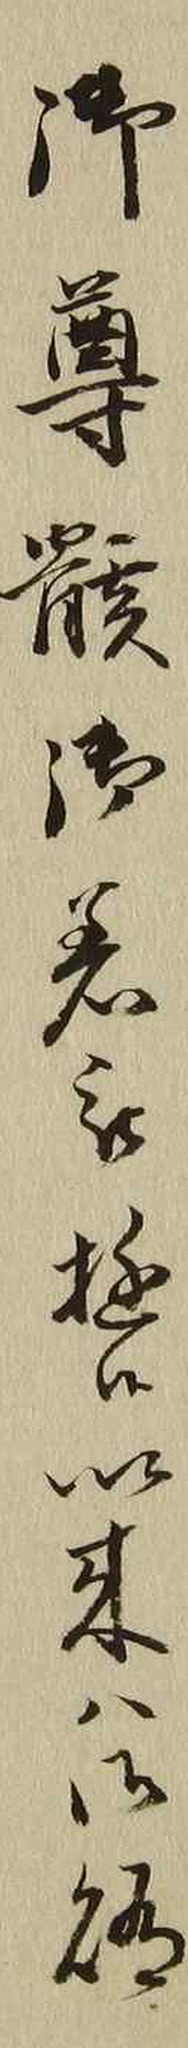御尊骸御着被遊候以来ハ御賄
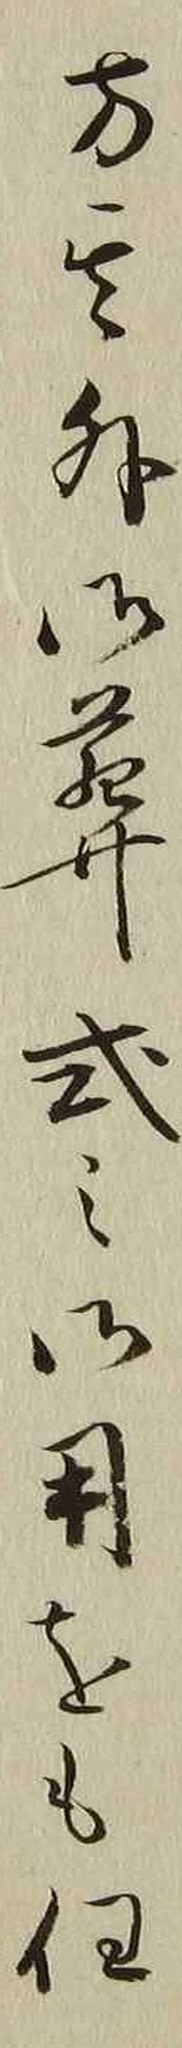方其外御葬式之御用をも任
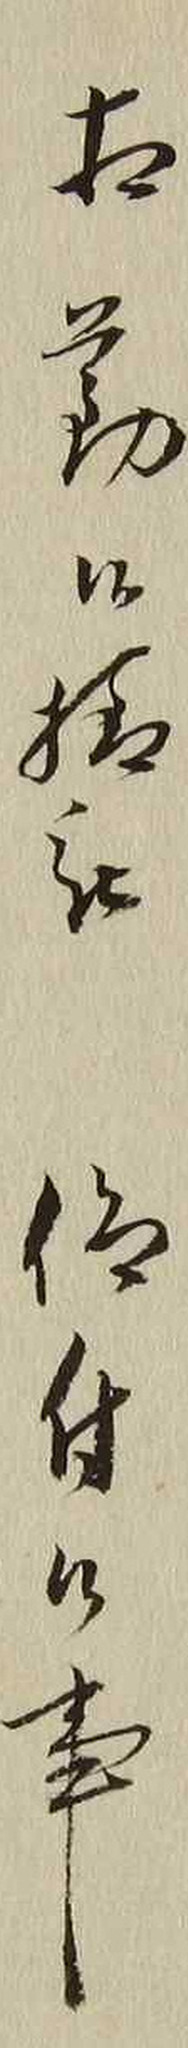相勤候様被仰付候事
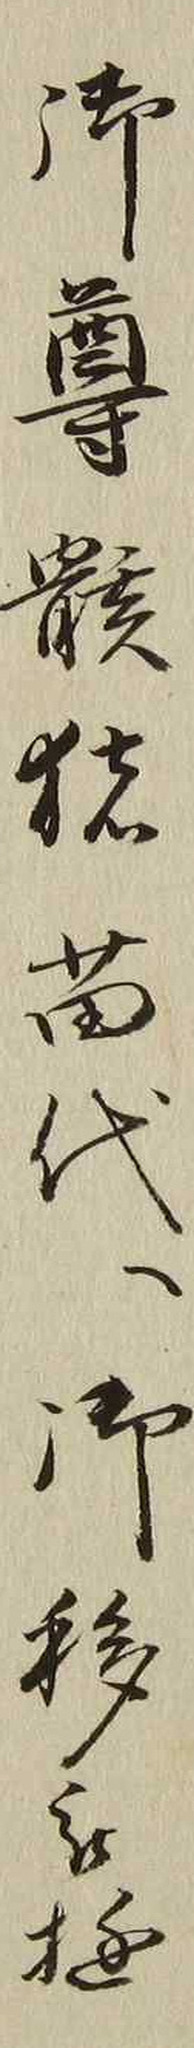御尊骸猪苗代へ御移被遊
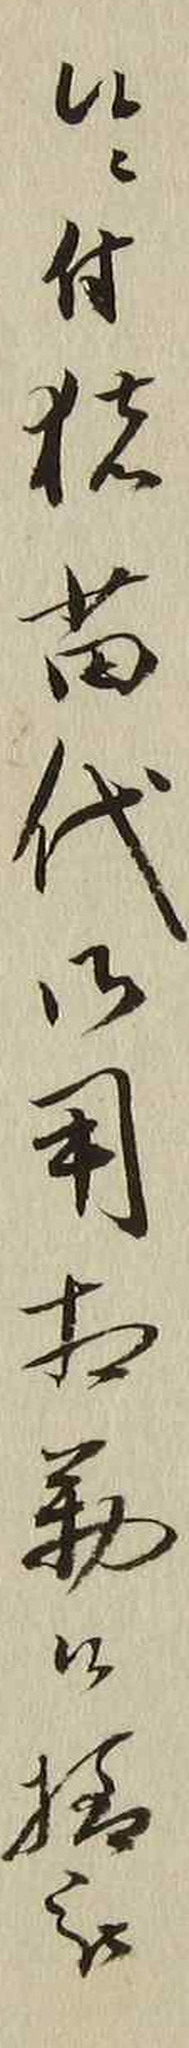候ニ付猪苗代御用相勤候様被
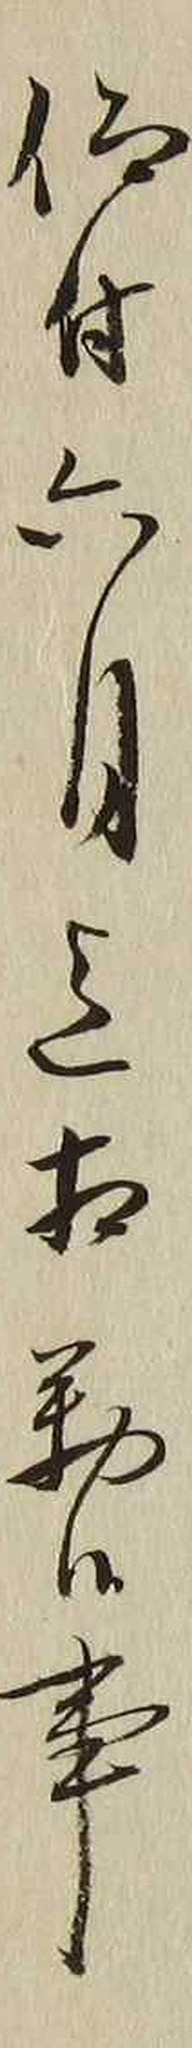仰付六月迄相勤候事
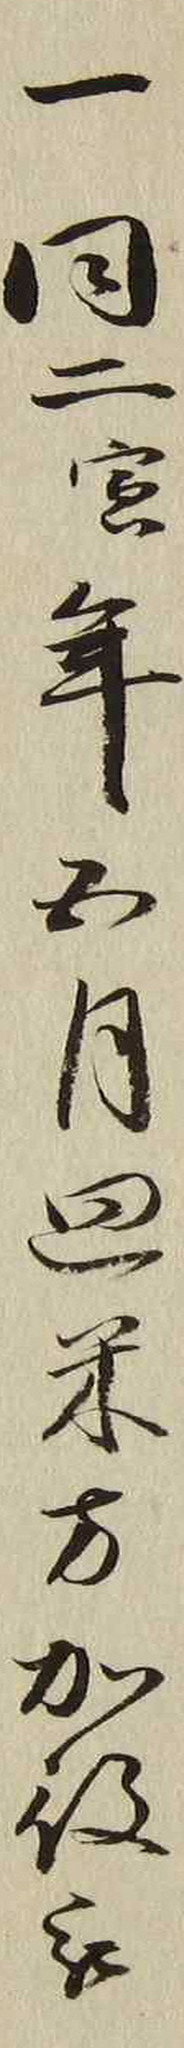一同二寅年五月廻米方加役被
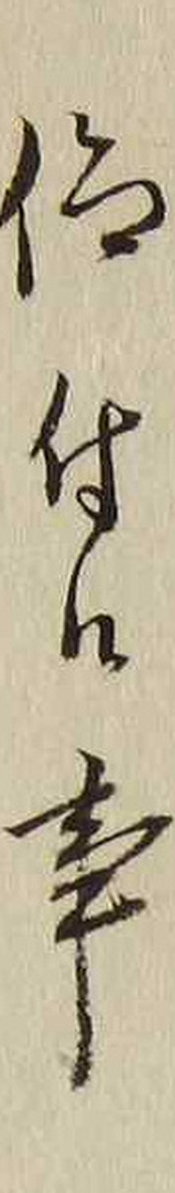仰付候事
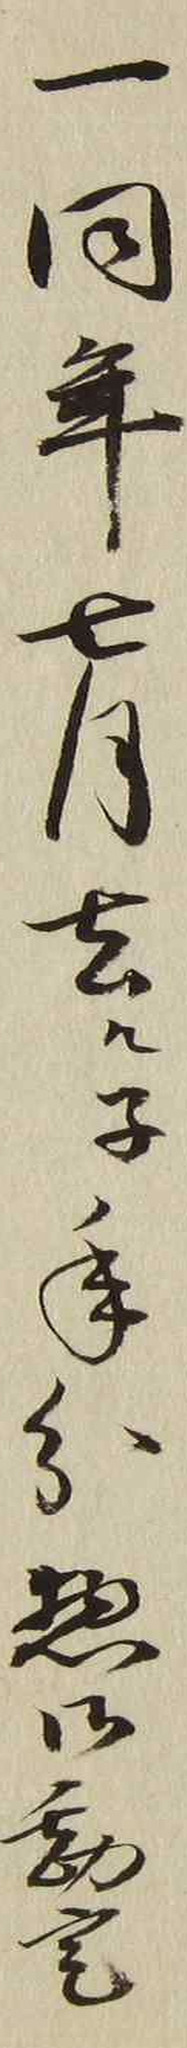一同年七月去ル子年分惣御勘定
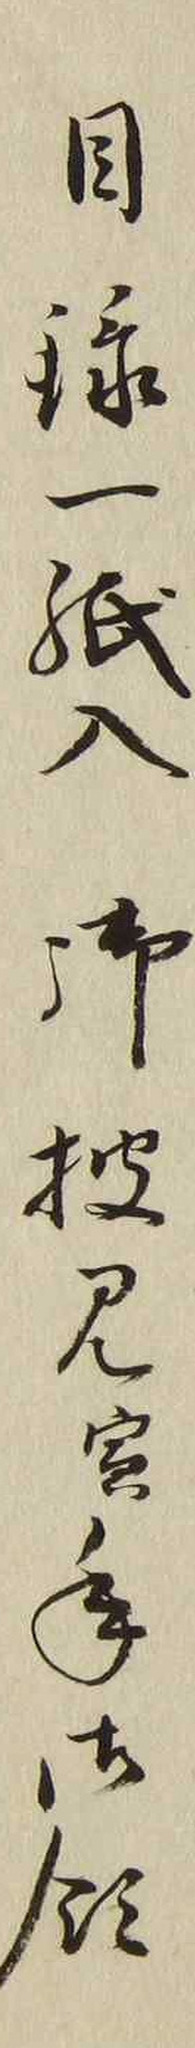目録一紙入御披見寅年御領

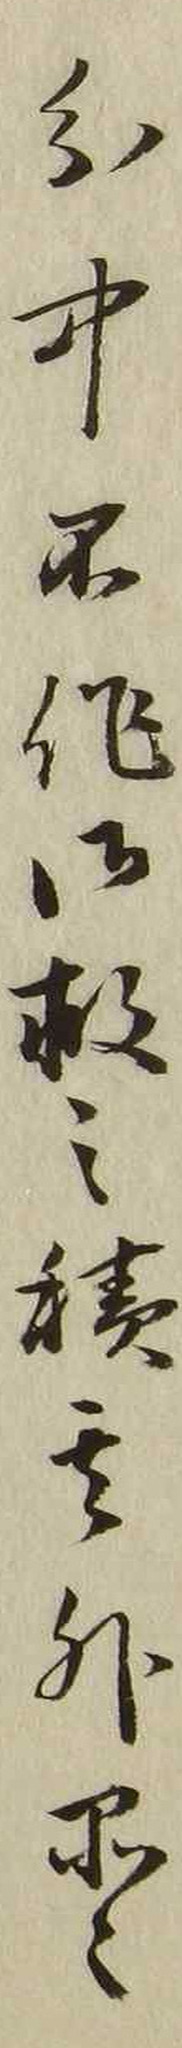分中不作御救之積其外品々
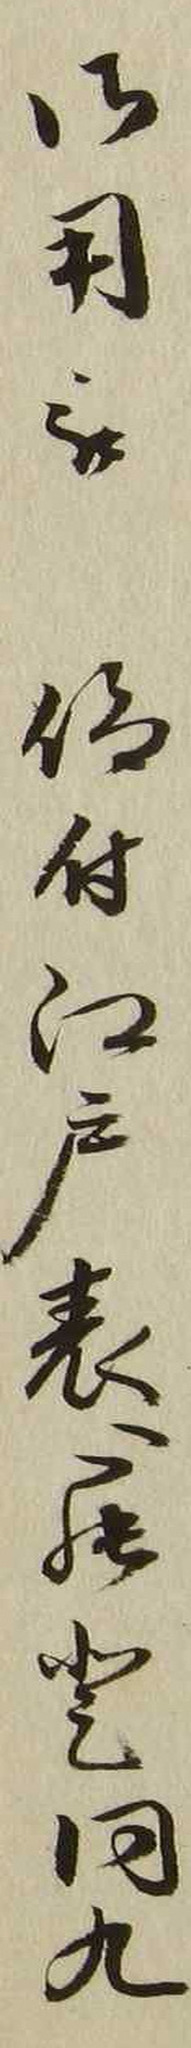御用被仰付江戸表へ罷登同九
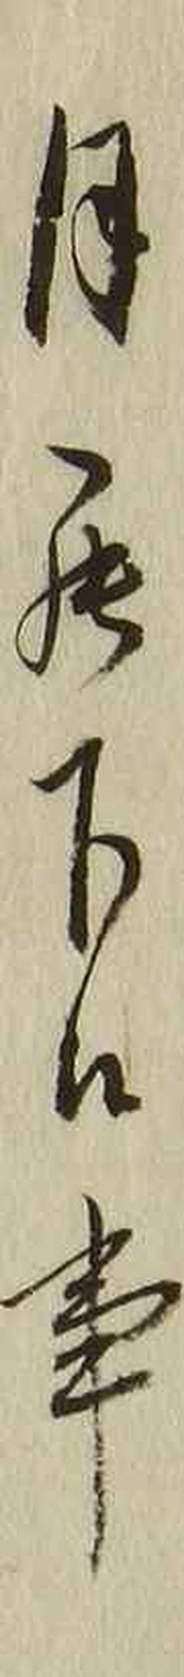月罷下候事
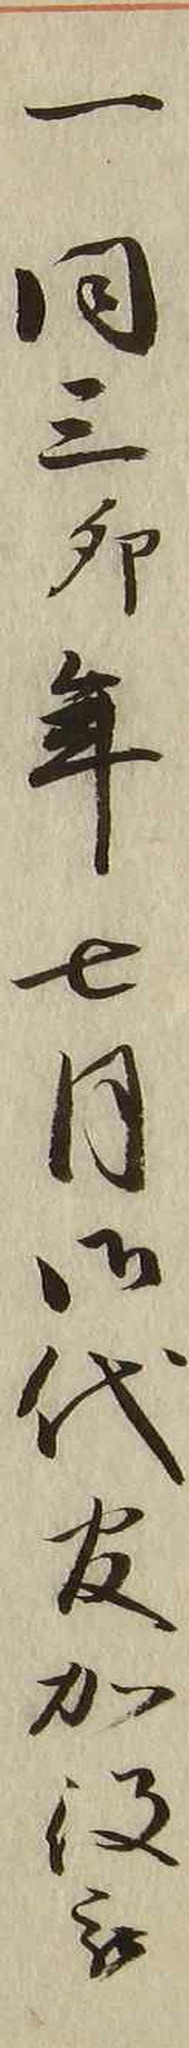一同三卯年七月御代官加役被
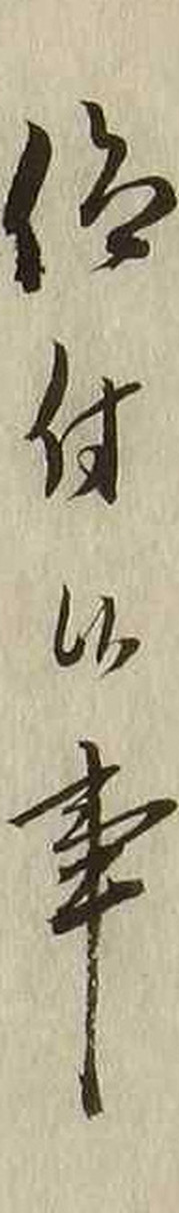仰付候事
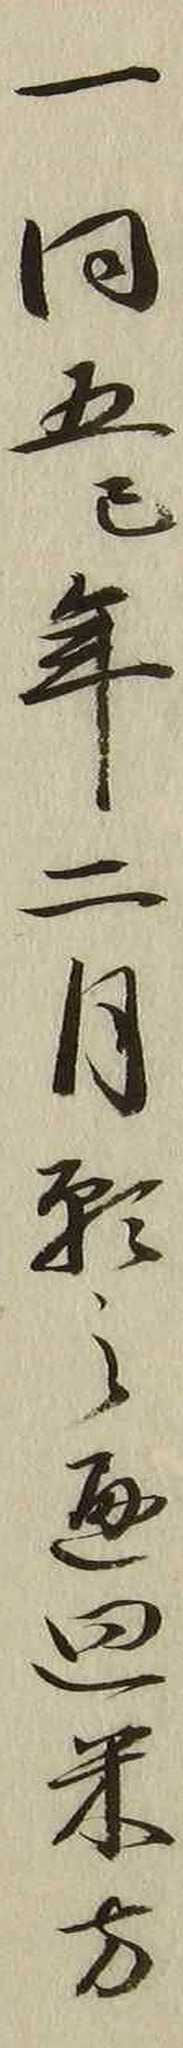一同五巳年二月願之通廻米方
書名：諸士系譜　巻之61　と之部4
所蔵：会津若松市立会津図書館
